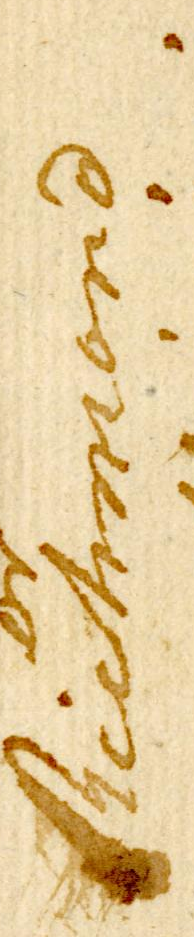Richmond
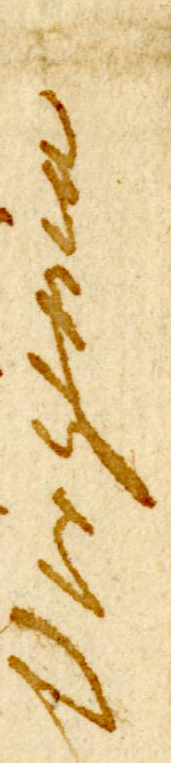Virginia
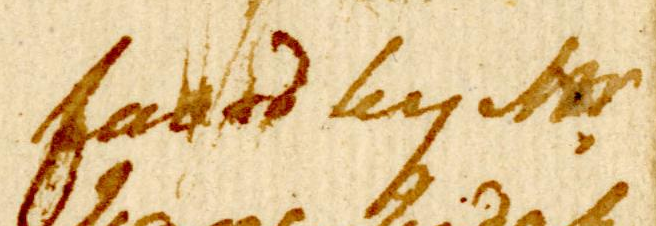Favor'd by M^r
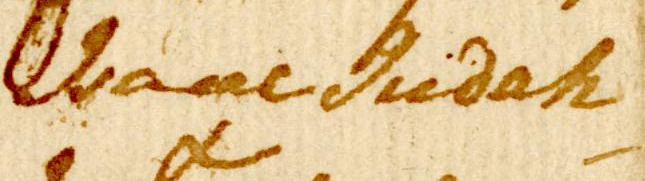Isaac Judak
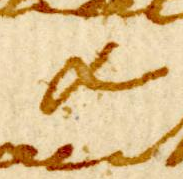&
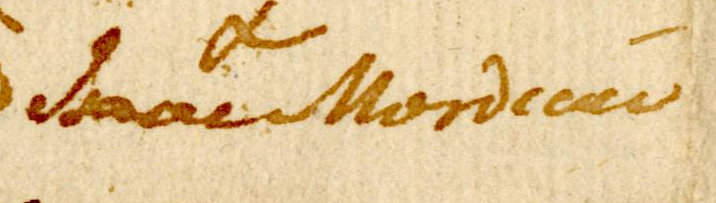Isaac Mordecai
